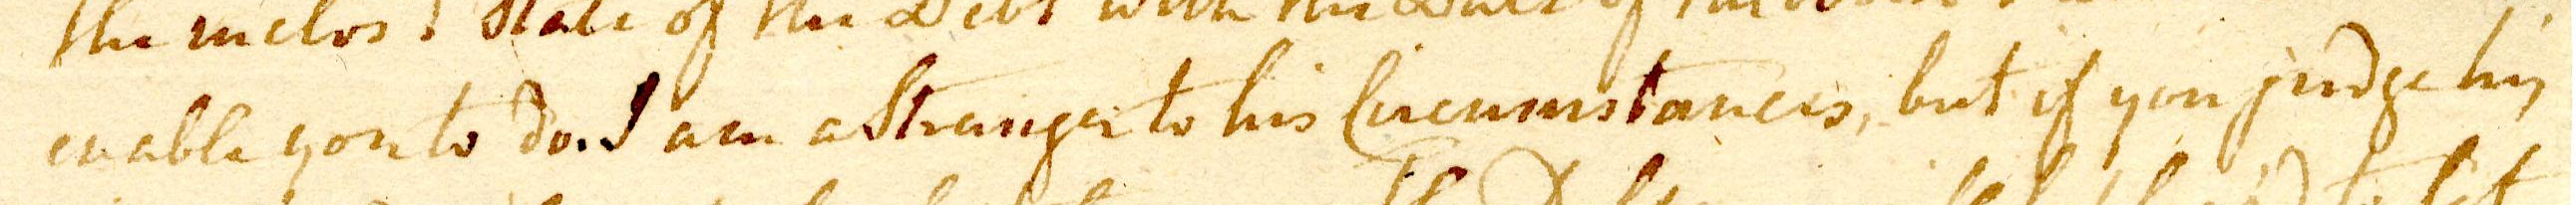enable you to do. I am a Stranger to his Circumstances, but if you judge his
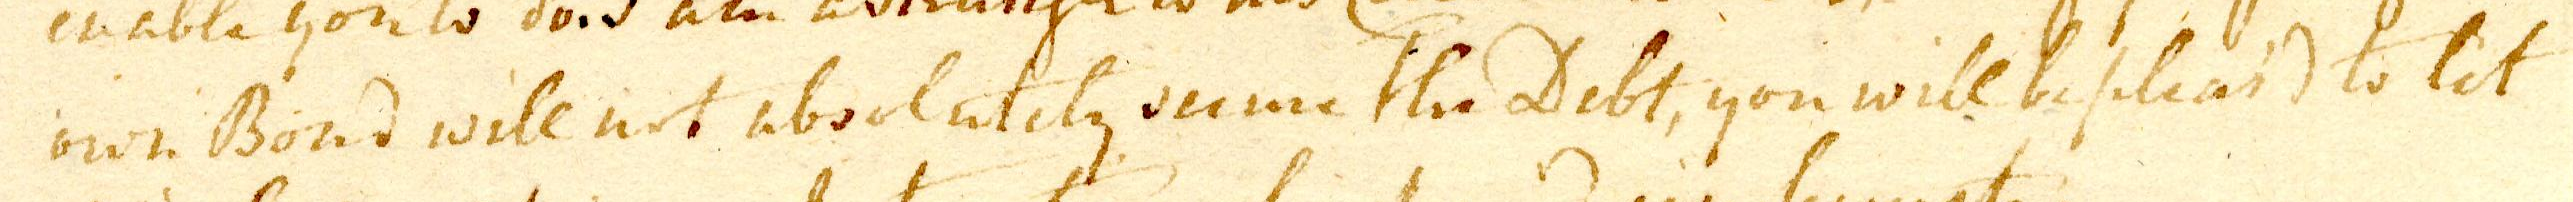own Bond will not absolutely secure the Debt, you will be pleas'd to let
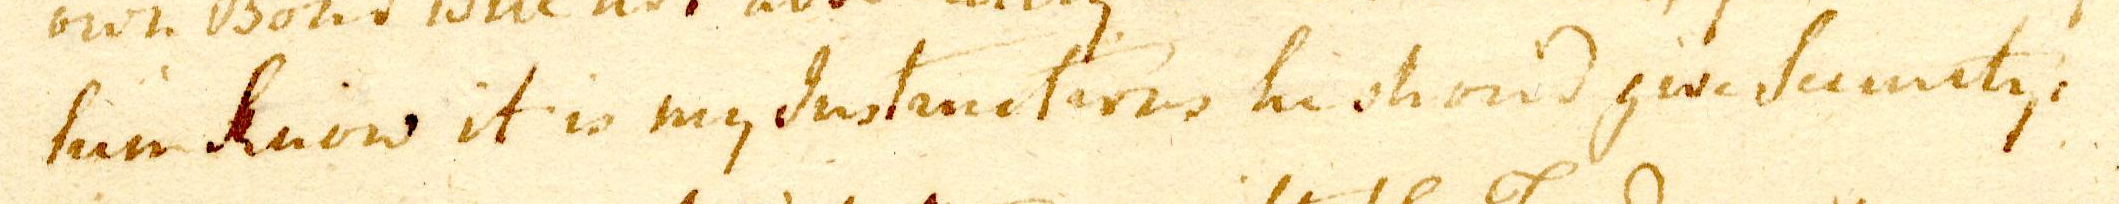him know it is my Instructions he shou'd give Security.
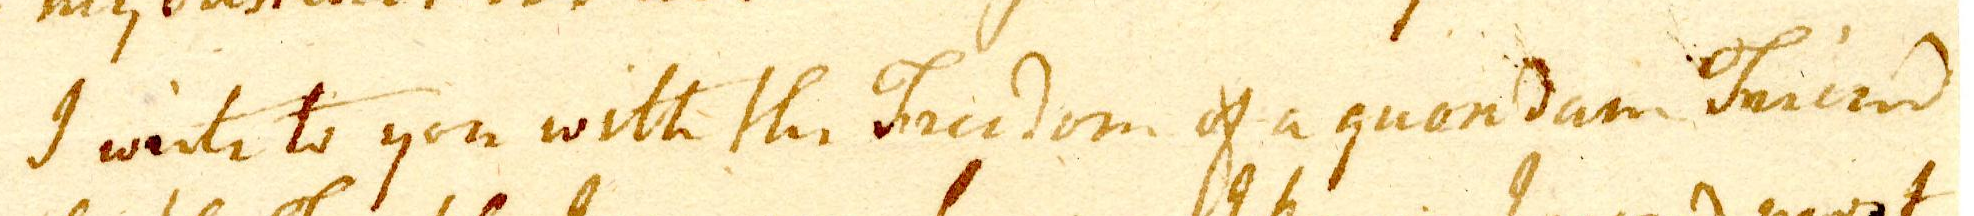I write to you with the Freedom of a quondam Friend
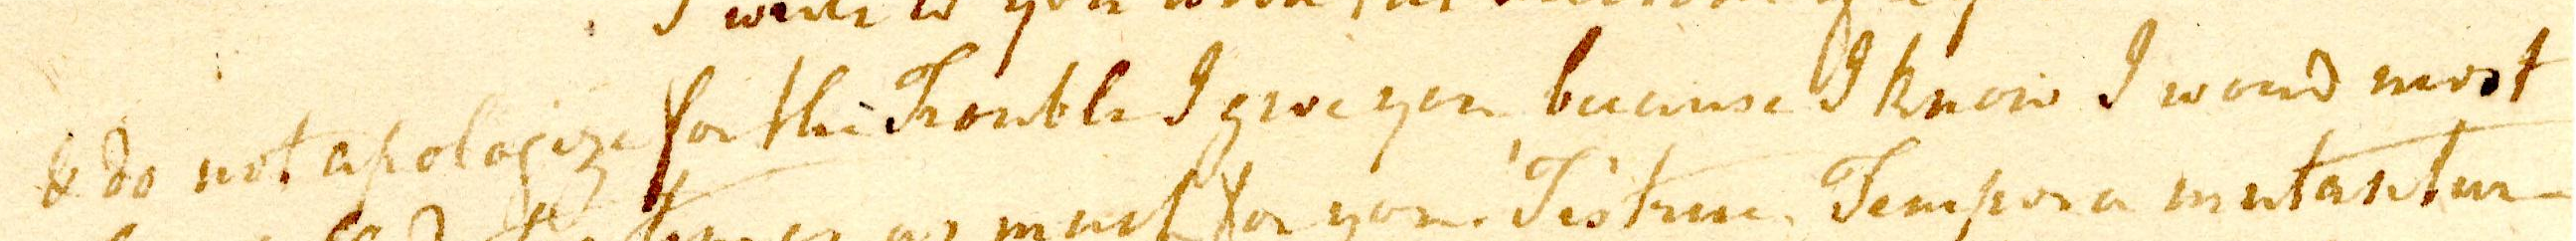& do not apologize for the Trouble I give yen because I know I wou'd most
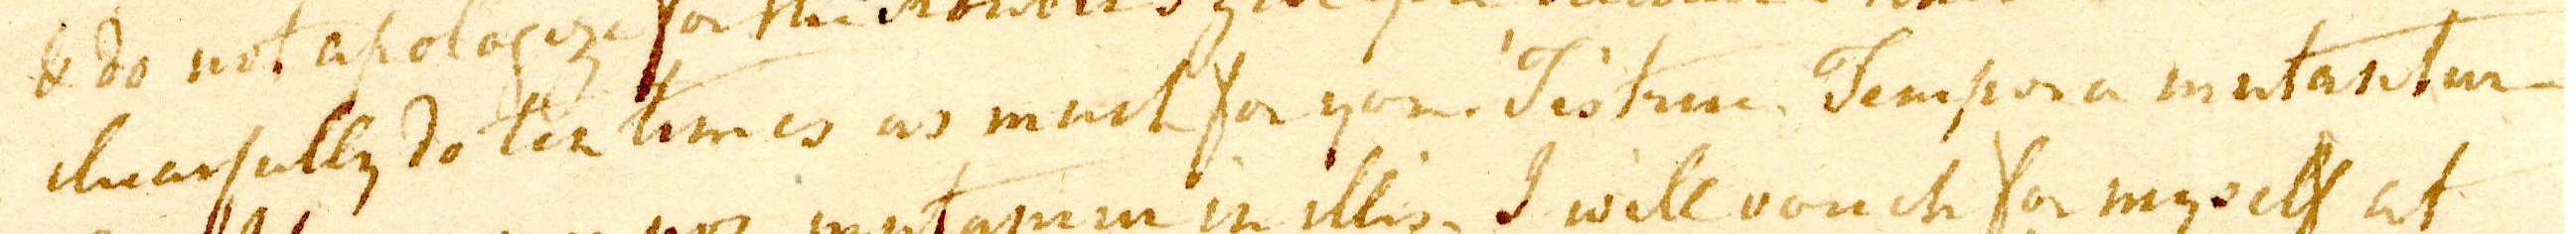chearfully do ten times as much for you. 'Tis true Temper a mutantur
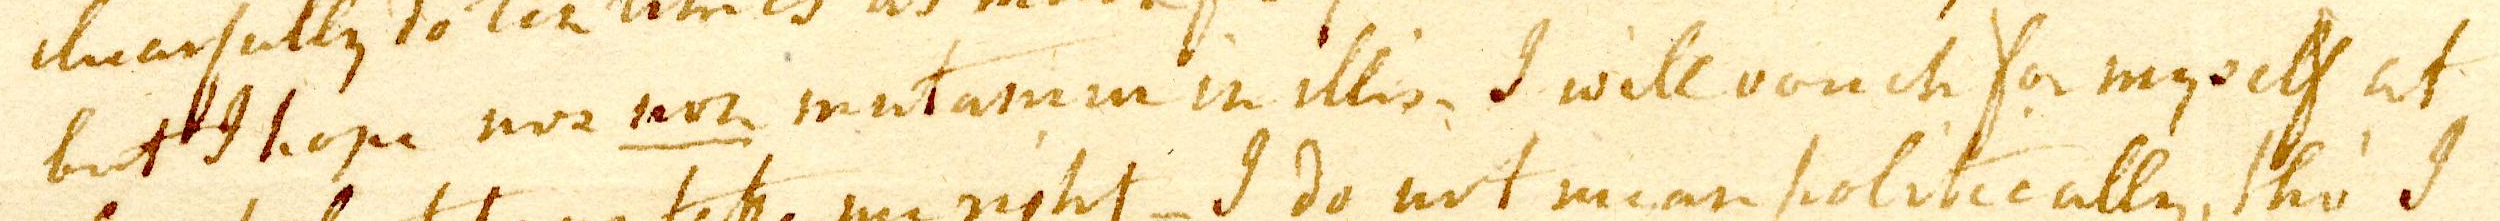but I hope was now inutamer in ills. I will vouch for myself at
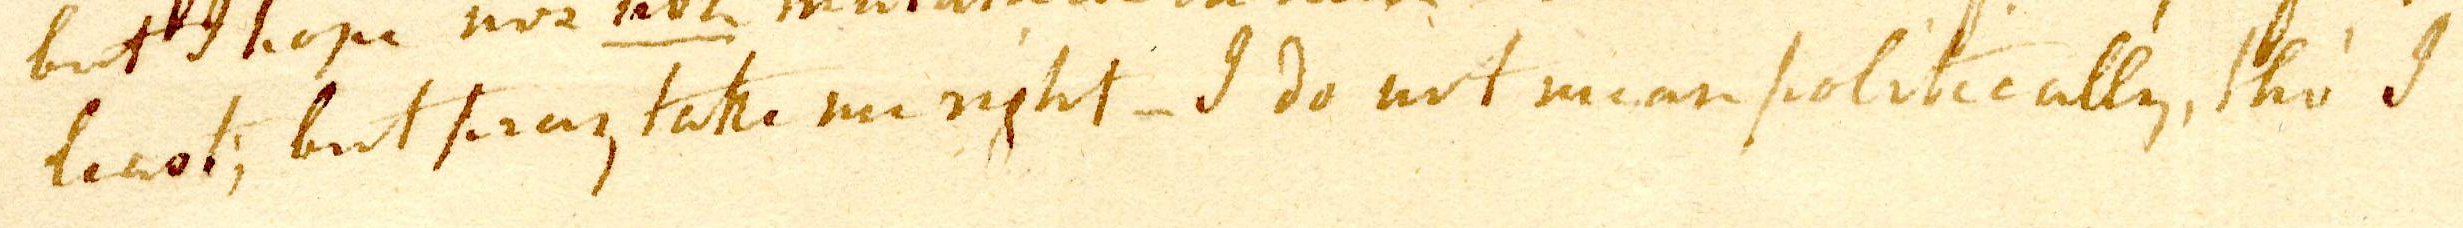least; but pray, take me right. I do not mean politically, tho' I
